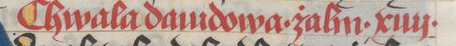Chwala davidowa.żalm.xiiij.
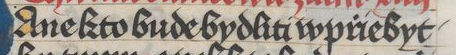Ane kto bude bydliti wpṙíebyt¬
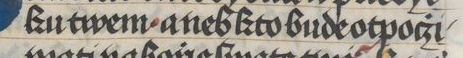ku twem.a neb kto bude otpocżi¬
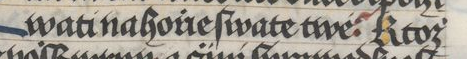wati nahoṙie ſwate twé.Ktoż
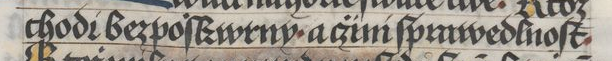chodí bezpoẛkwrny.a cżiní ſprawedlnoſt.
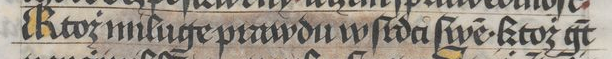Ktoż miluge prawdu w ſrdci ſwē.ktoż ḡt
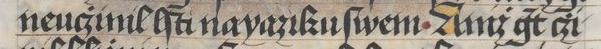neucżinil lſti na yaziku ſwem.Aniż ḡt cżi¬
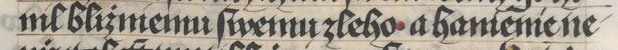nil bliżniemu ſwemu zleho.a hanienie ne¬
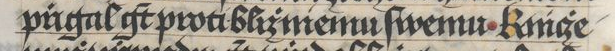pṙigal ḡt proti bliżníemu ſwemu.Knicże¬
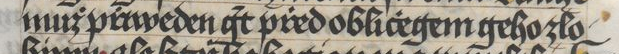muż pṙiweden ḡt pṙed obliċegem geho zlo¬
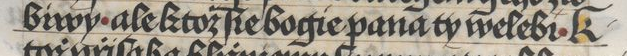biwy.ale ktož ſie bogie pana ty welebí.K¬
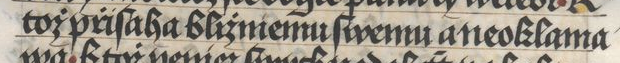tož pṙiſaha bližniemu ſwemu a neoklama¬
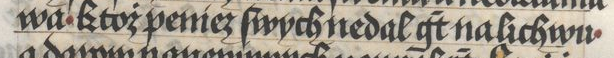wa.ktoż peniez ſwych nedal ḡt na lichwu.
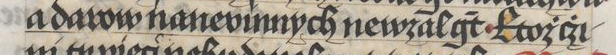a darow nanevinnych newzal ḡt.Ktoż cżi¬
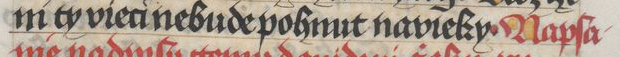ni ty vieci nebude pohnut navieky.Napſa¬
